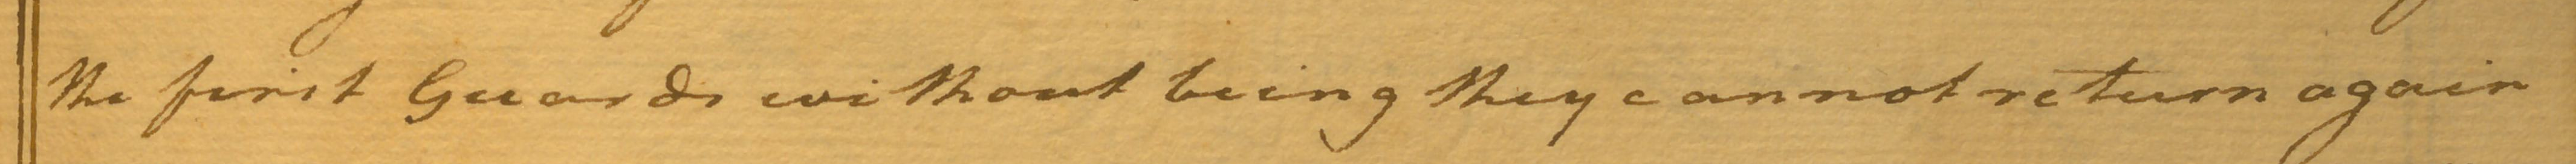the first Guards without being they cannot return again
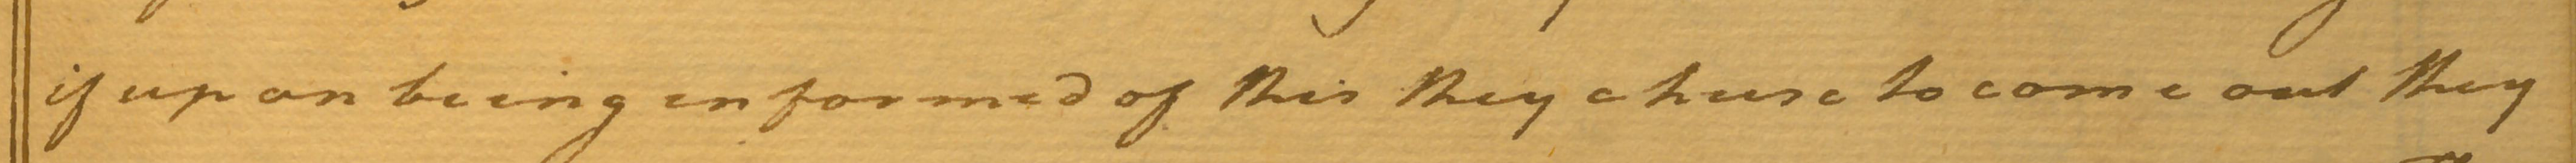if upon being informed of this they chuse to come and they
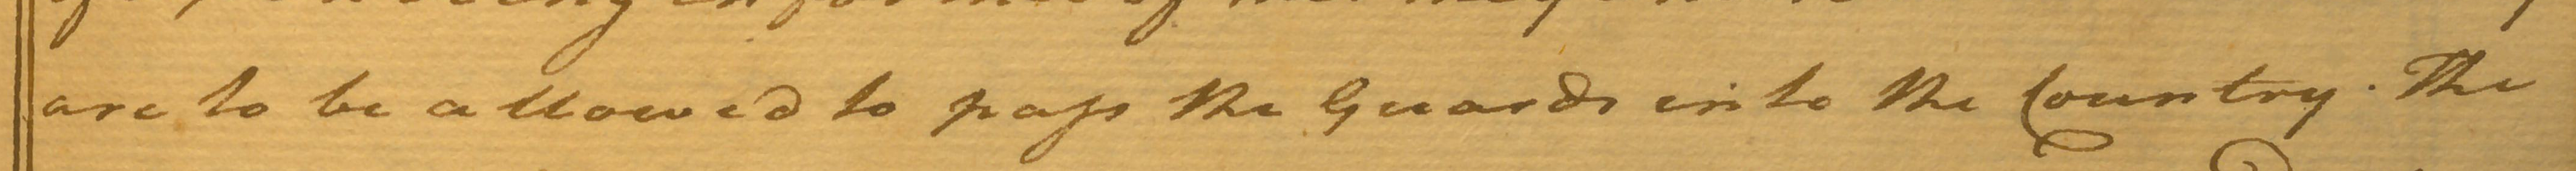are to be allowed to pass the Guards into the Country. The
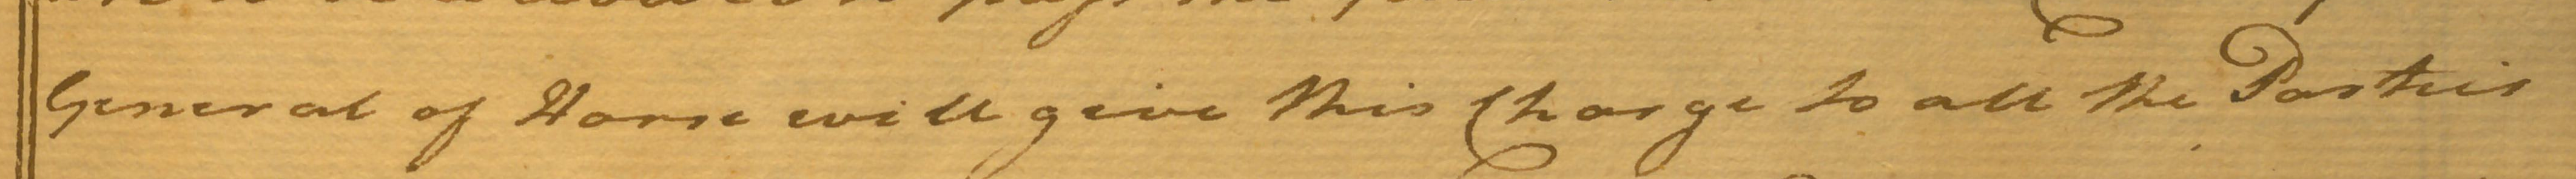General of Horse will give this Charge to all the Parties
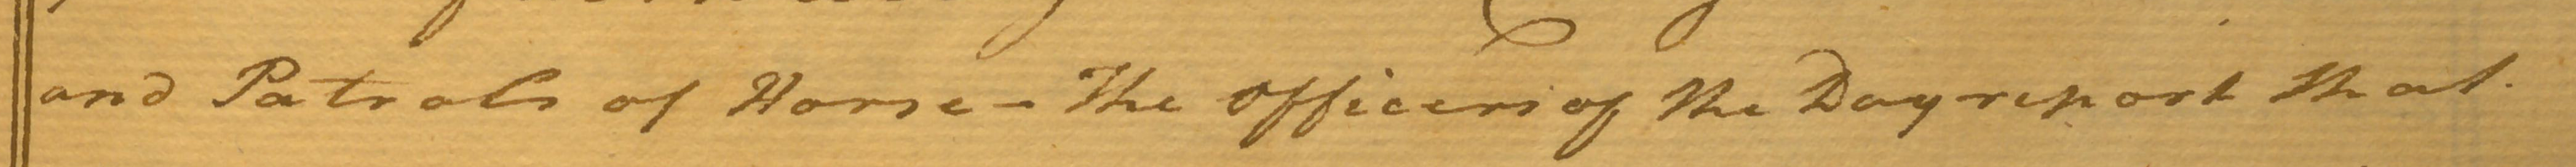and Patrols of Horse- The Officers of the Day report that
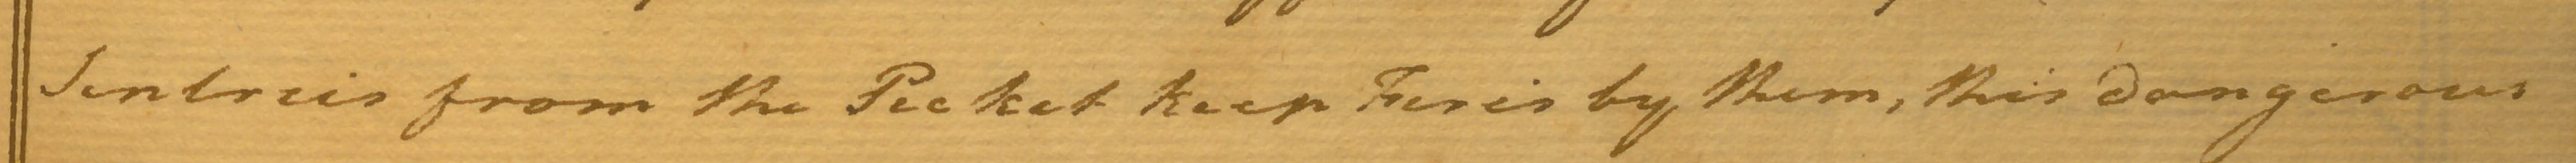Sentries from the Picket keep Fires by them, this dangerous
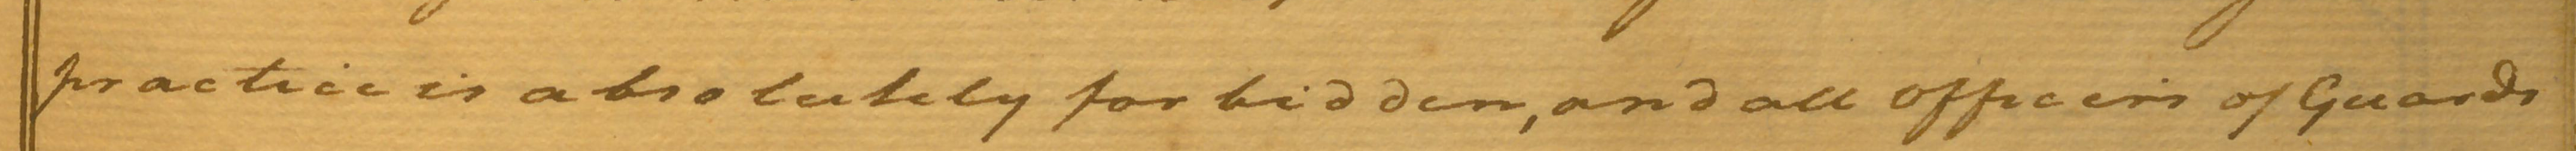practice is absolutely forbidden, and all Officers of Guards
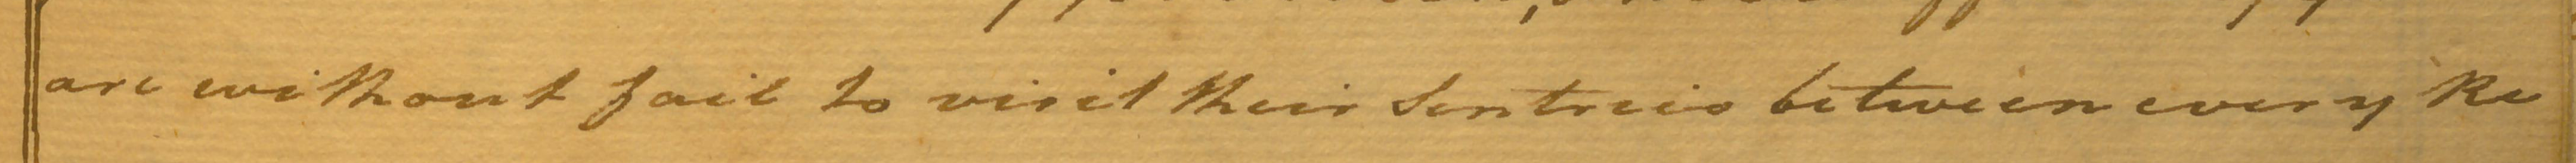are without fail to visit their Sentries between every Re
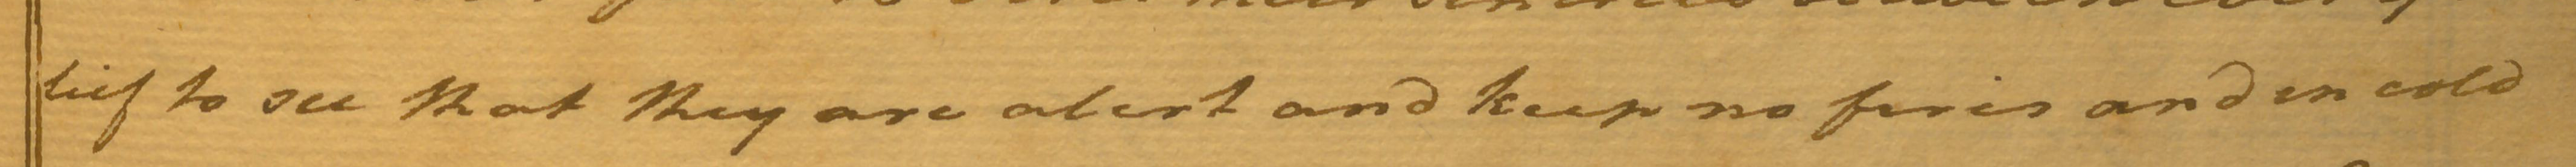lief to see that they are alert and keep no fires and in cold
